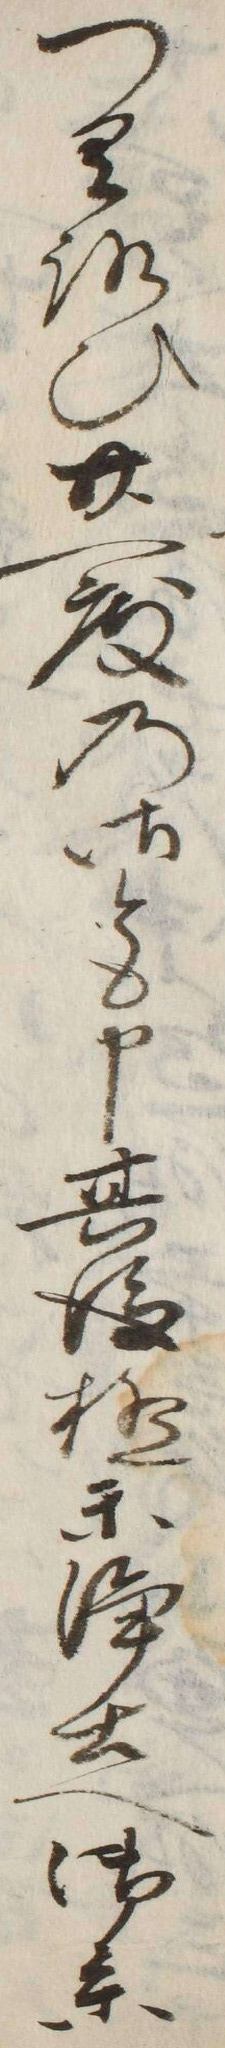つくろひ廿一度の御とも申其後極楽浄土へ御参
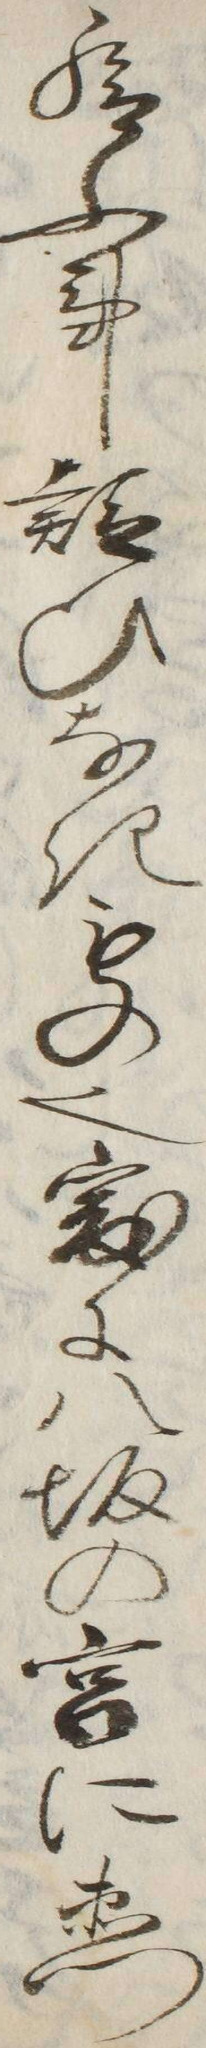給ふ事疑ひなきもの也爰に八坂の宮に衛門
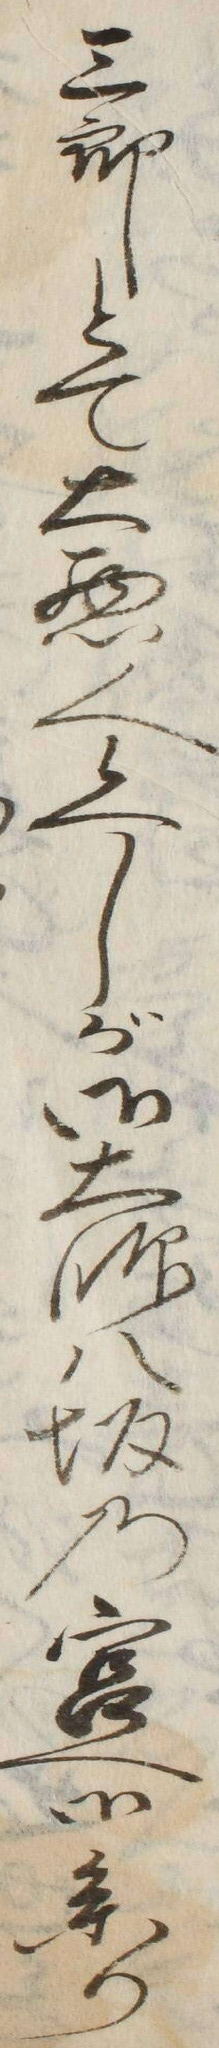三郎とて大悪人候へしが御大師八坂の宮へ御参り
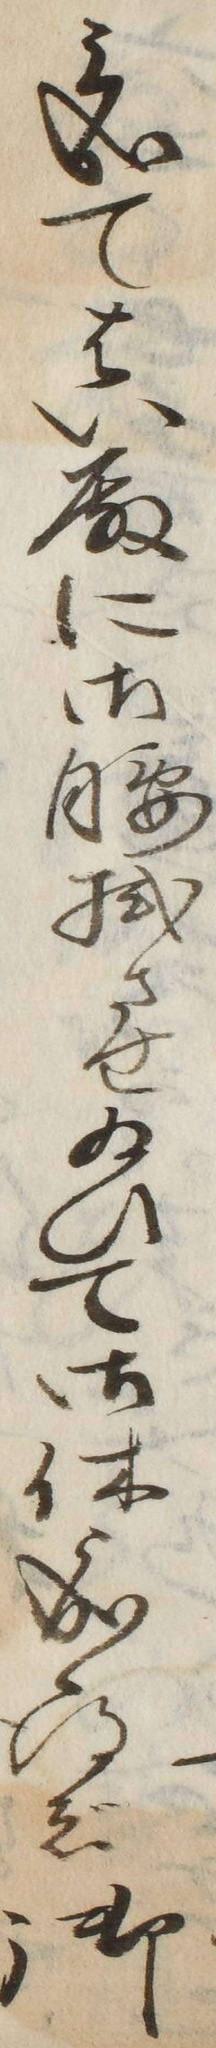被成てはい殿に御腰掛させ給ひて御休被成候得は御
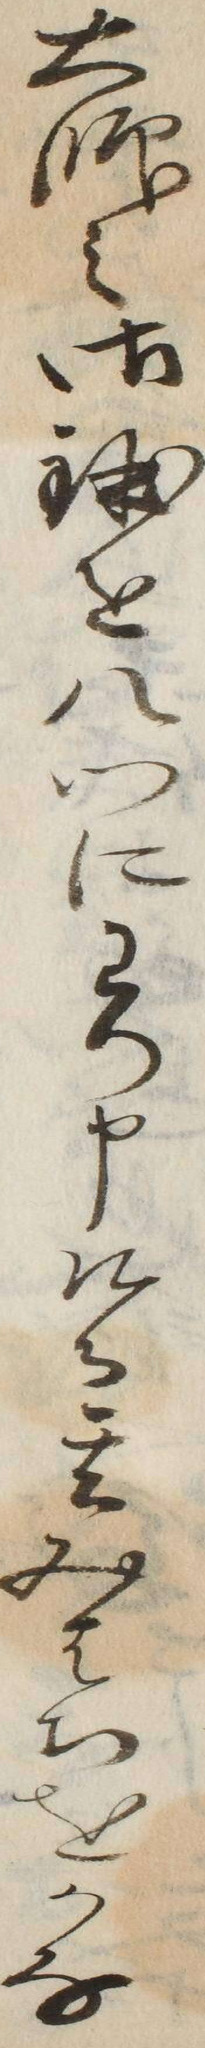大師之御鉢を八つにわり申ける其みはちをかな
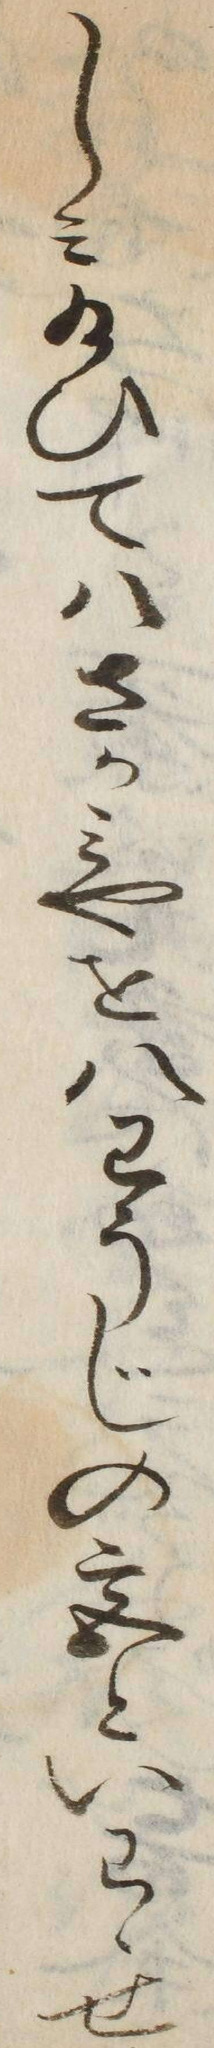しみ給ひてはさかみやを八わうじの宮といわゝせ
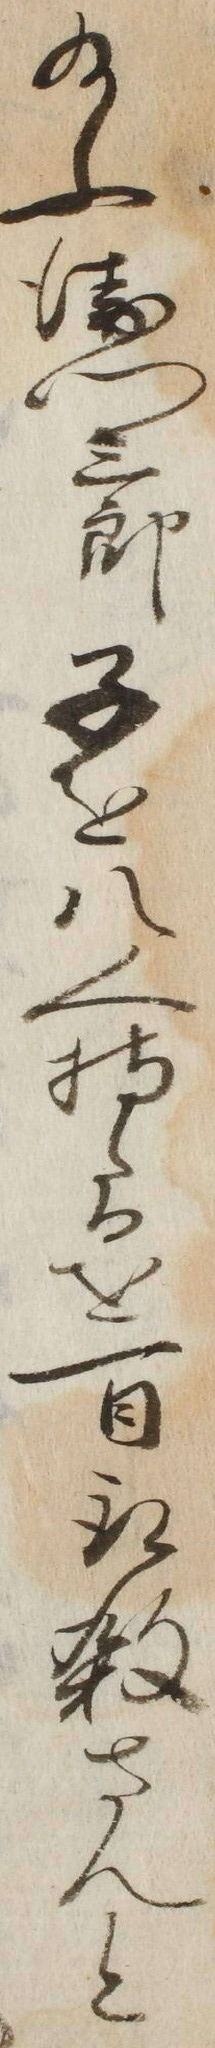給ふ衛門三郎子を八人持たるを一日取殺さんと
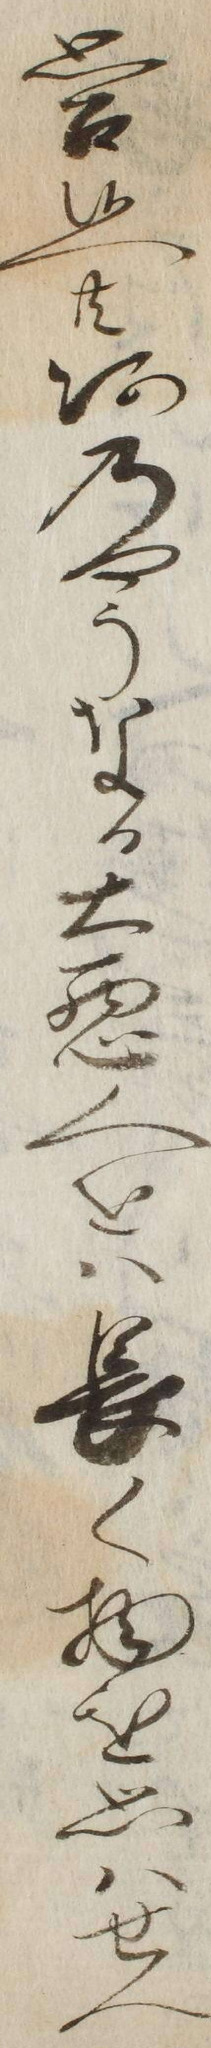思召候へ共あのやうなる大悪人をは長く物を思はせん
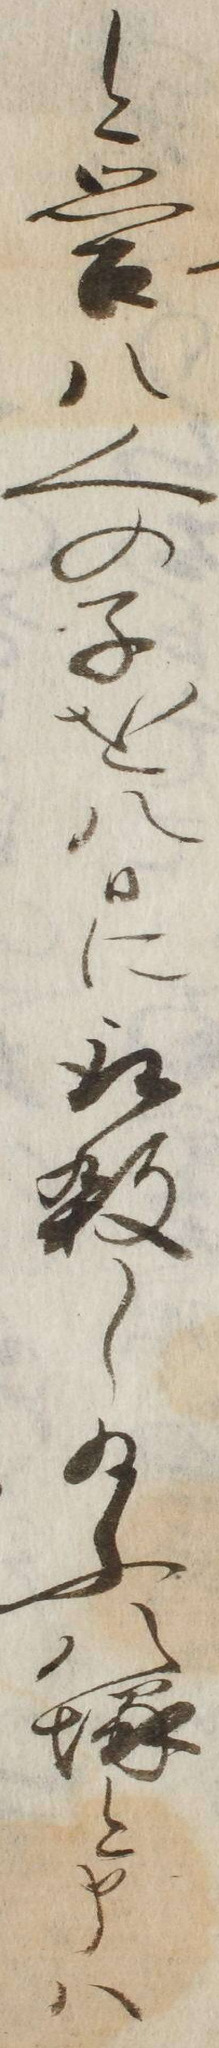と思召八人の子を八日に取殺し給ふ八塚と申は
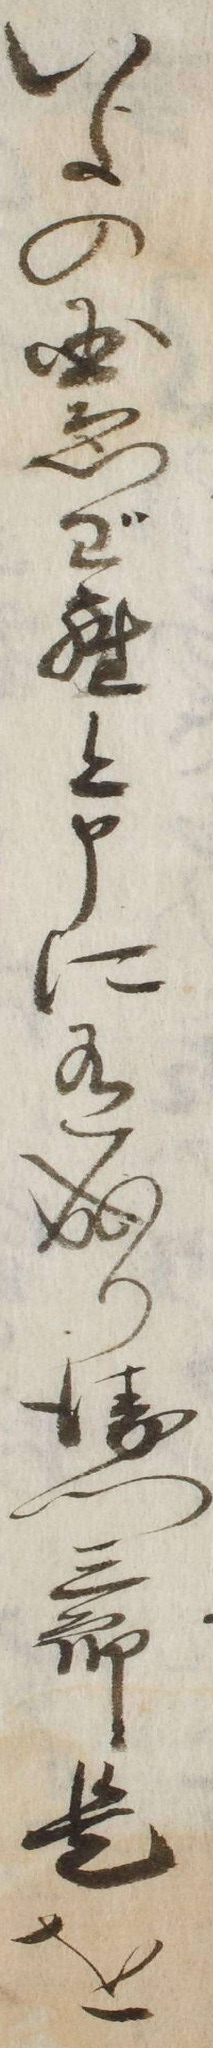いよの国ゑばらと申に有成り衛門三郎是を
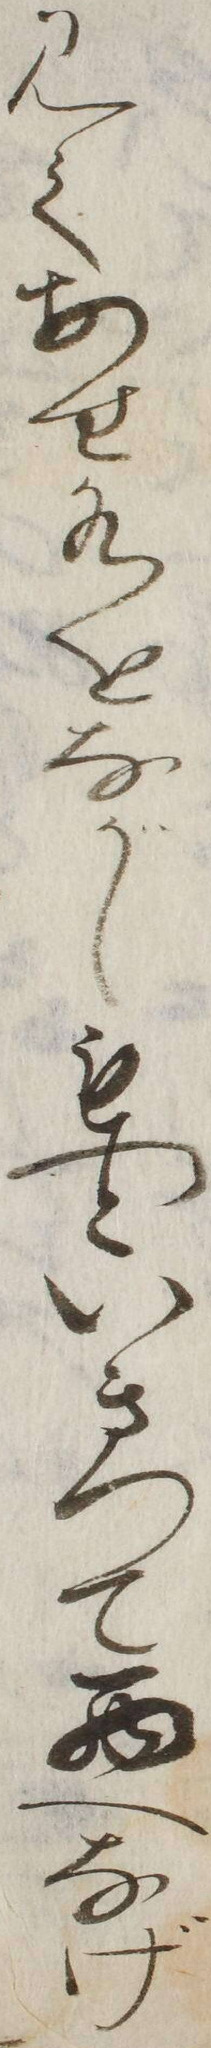見てあせ水をなかしもつといきつて西へなげ
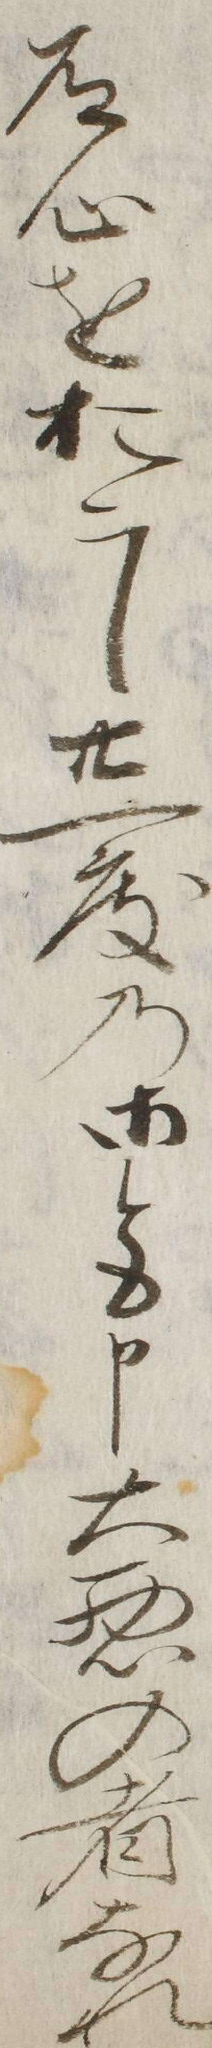道心をおこし廿一度の御とも申大悪の者なれ
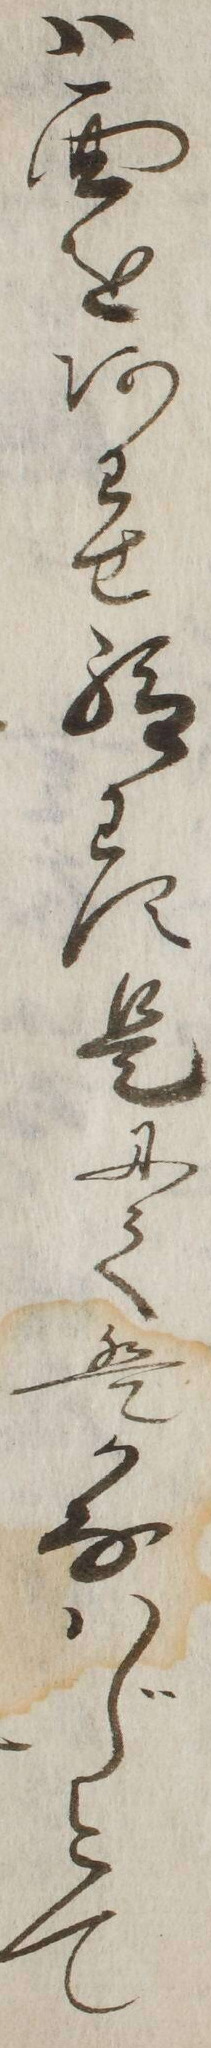は面をあわせ給わき是にてはかなはじとて
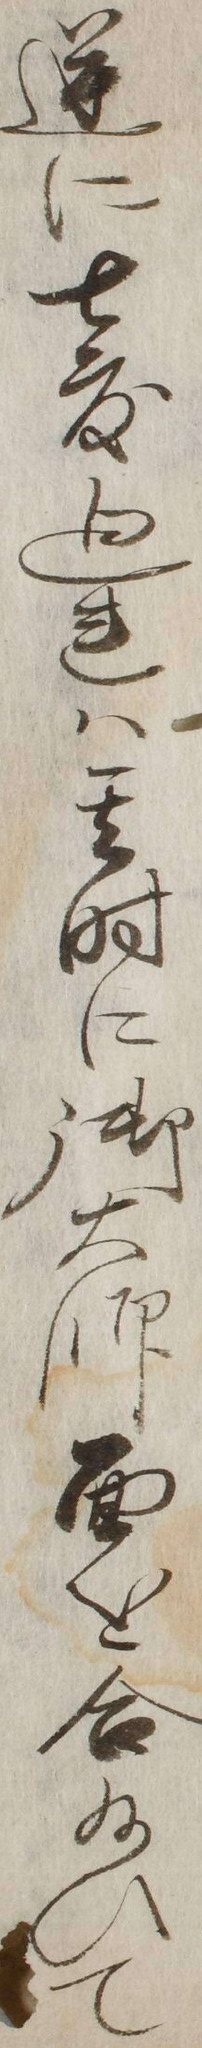遂に七度廻れは其時に御大師面を合給ひて
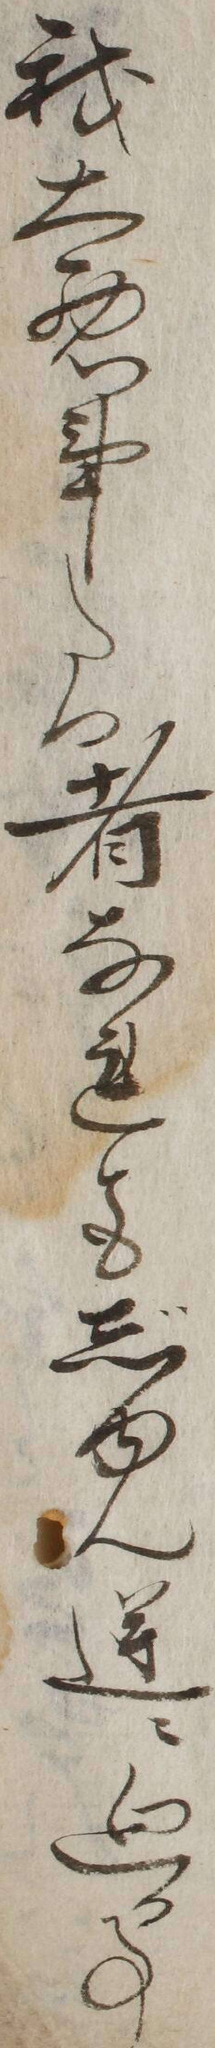我大悪事たる者なれともじゆん逆に廻る事

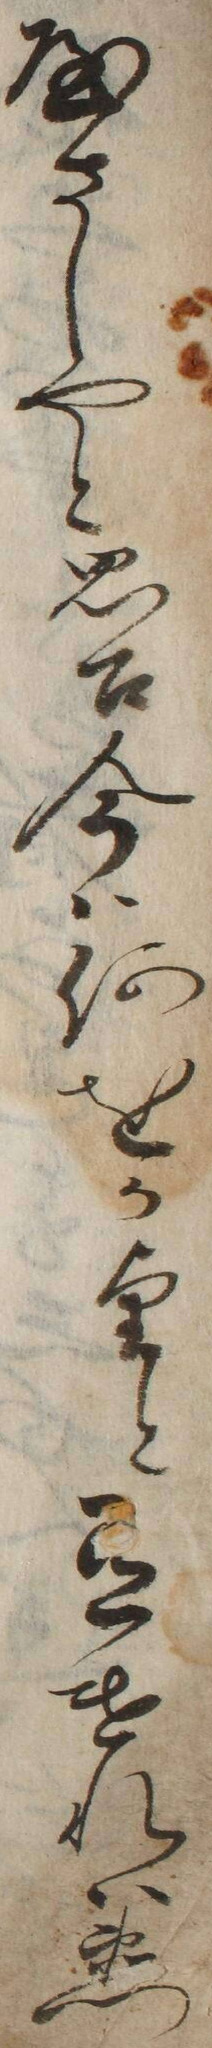やさしやと思召今は何をか望と有けれは衛門
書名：奉弘法大師御傳記
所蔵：国文学研究資料館
